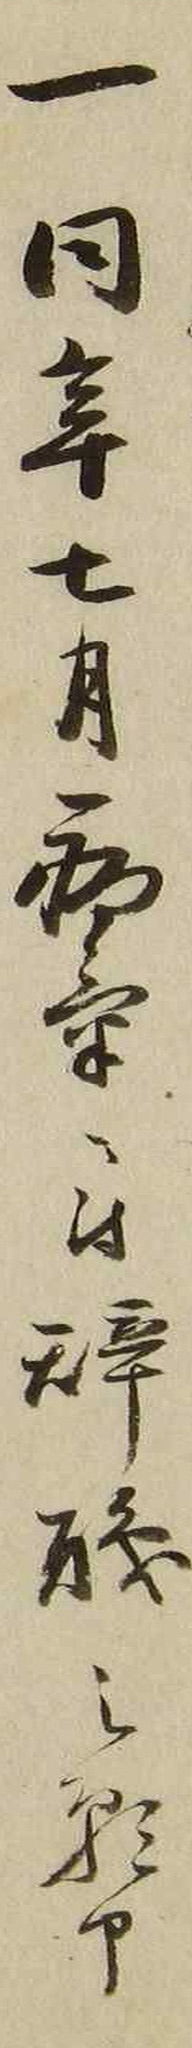一同年七月病気に付辞職之願申
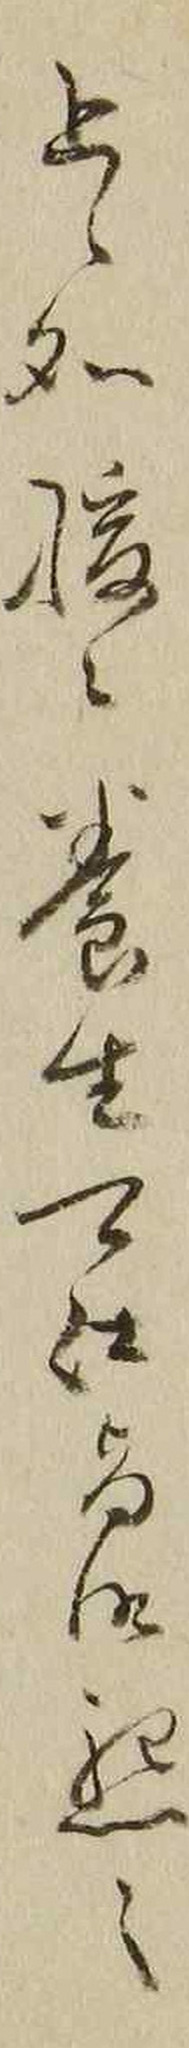上候処緩々養生可仕旨御懇之
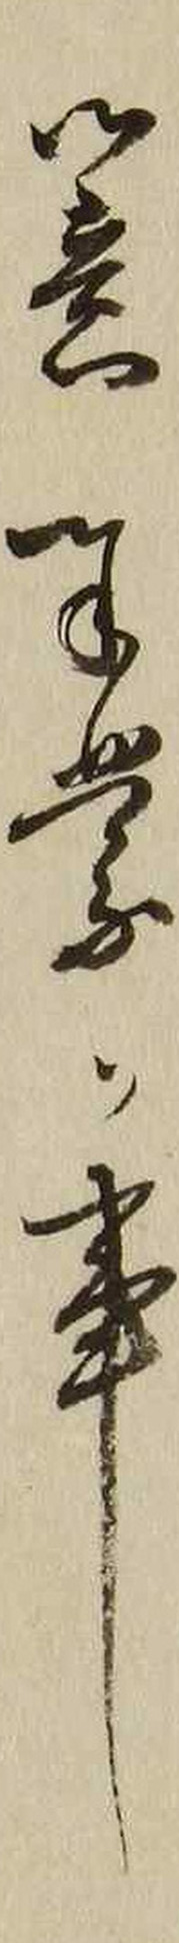御意奉蒙候事
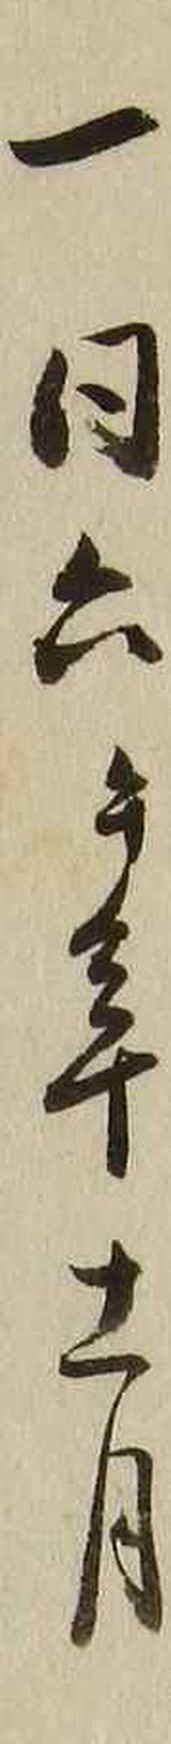一同六午年十一月
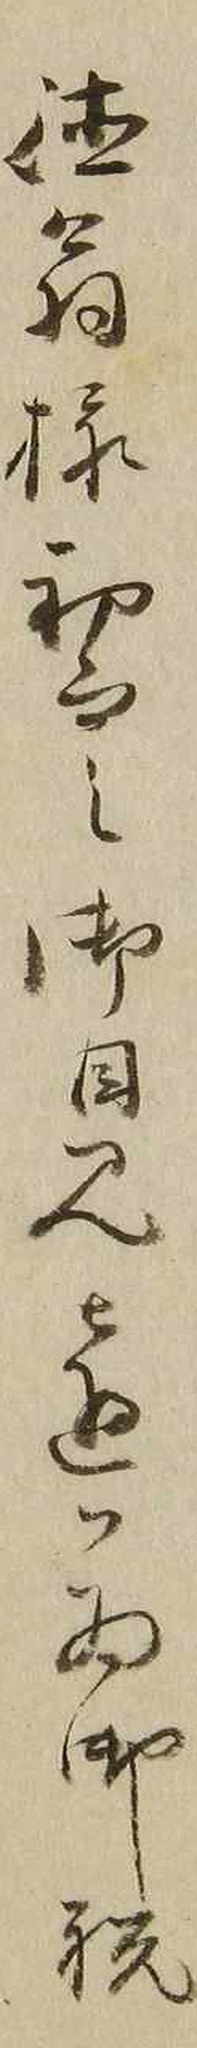徳翁様初而之御目見被遊候為御祝
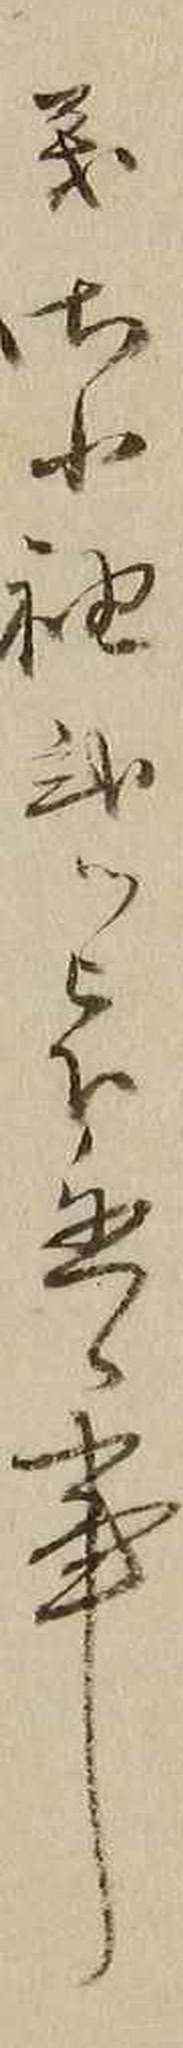義御小袖弐つ被下置候事
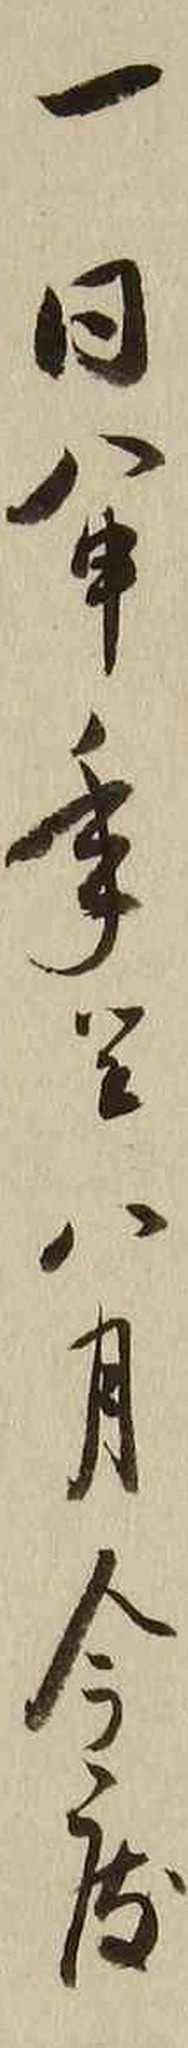一同八申年閏八月今度
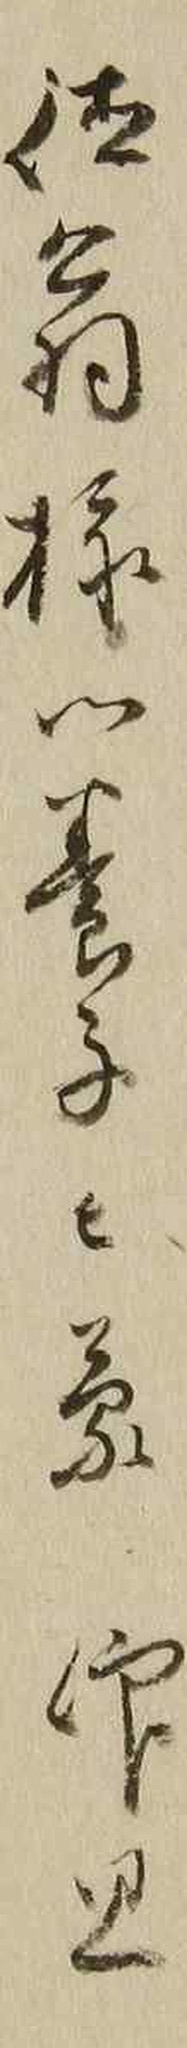徳翁様御養子被仰同上
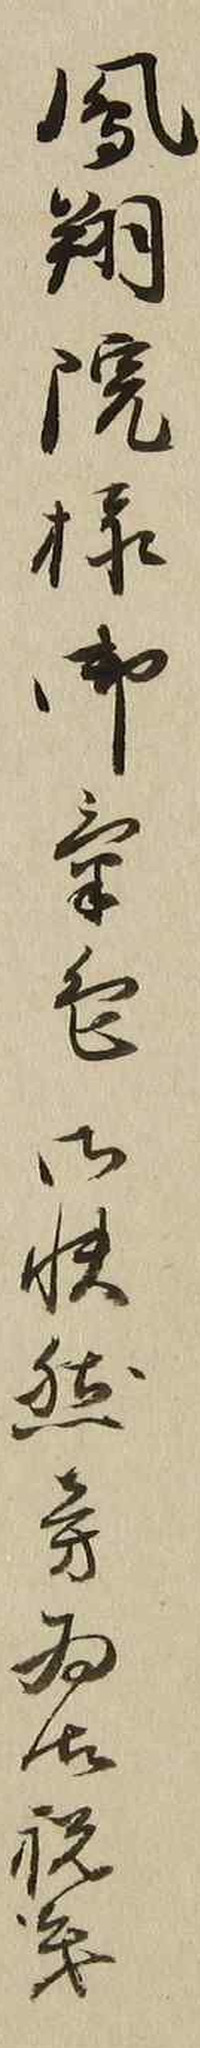鳳翔院様御気色御快然旁為御祝義
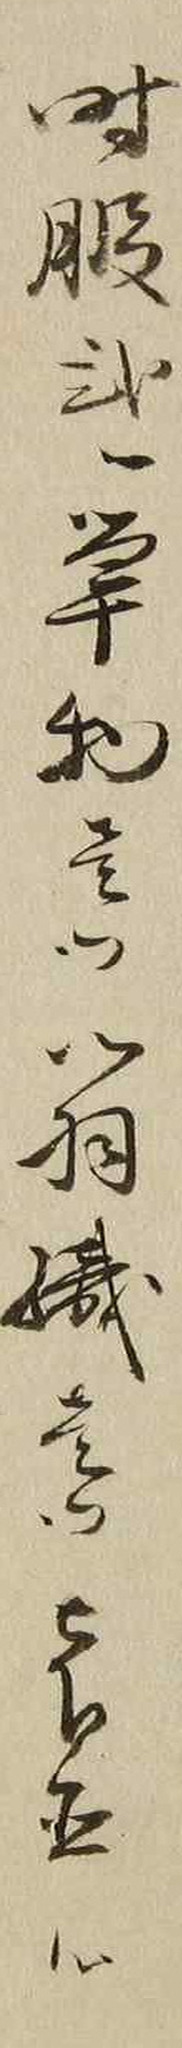時服弐つ単物一つ御羽織壱つ被下置候
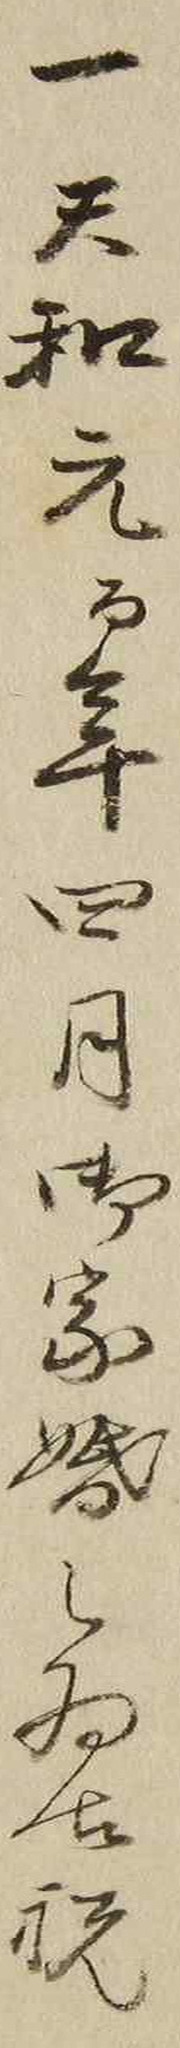一天和元酉年四月御家督之為御祝
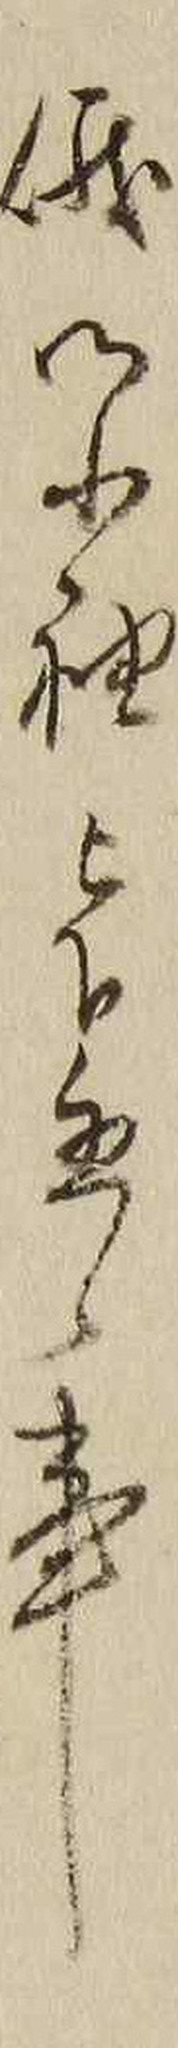儀御小袖被下置候事
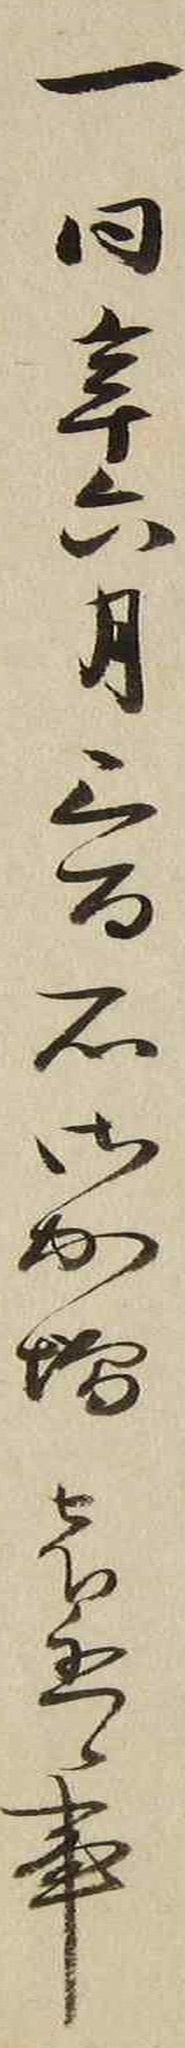一同年六月三百石御加増被下置候事
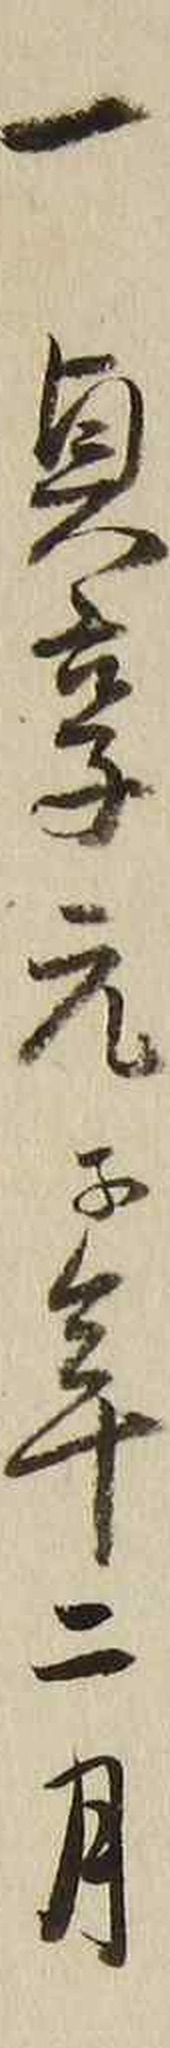一貞享元子年二月
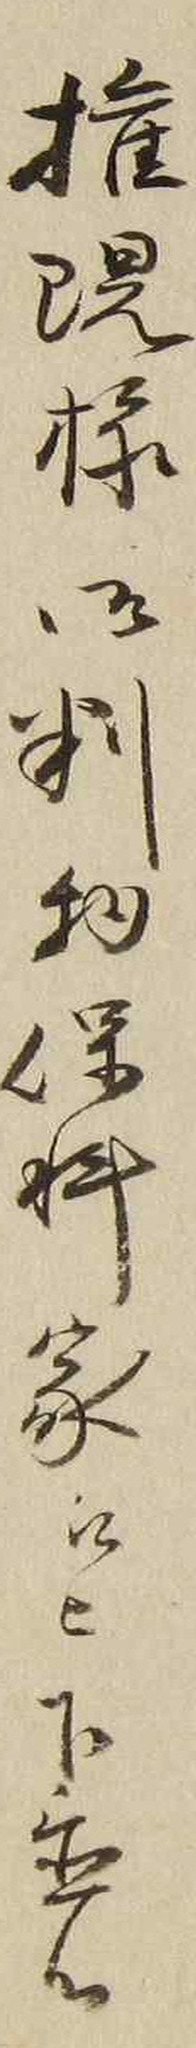権現様御判物保科家江被下置候
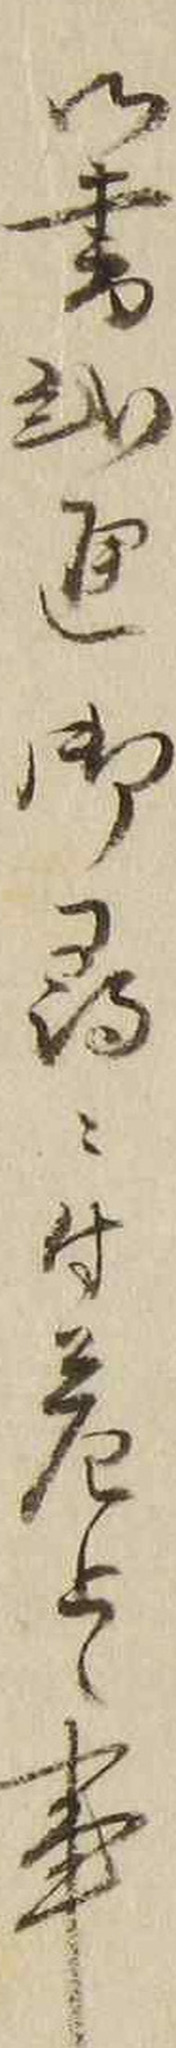御書弐通御尋に付差上候事
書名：諸士系譜　巻之269　さ之部1
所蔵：会津若松市立会津図書館
